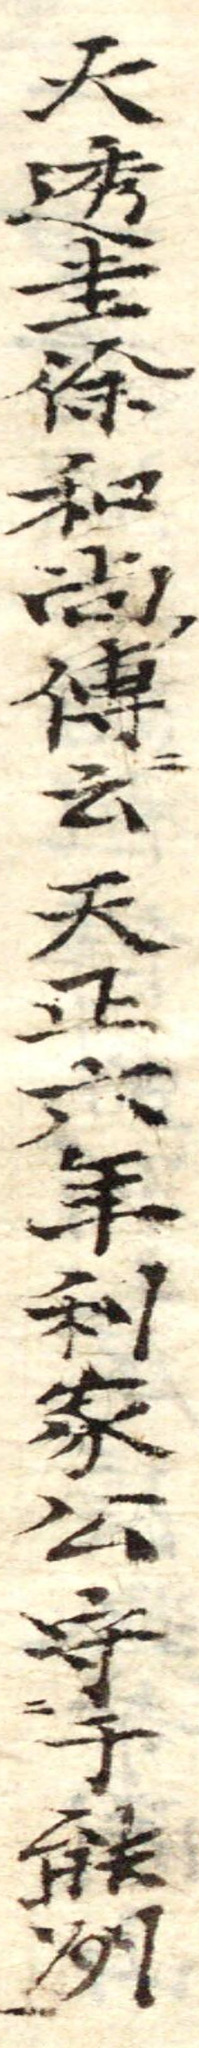大透圭徐和尚の傳に云天正六年利家公守干能州
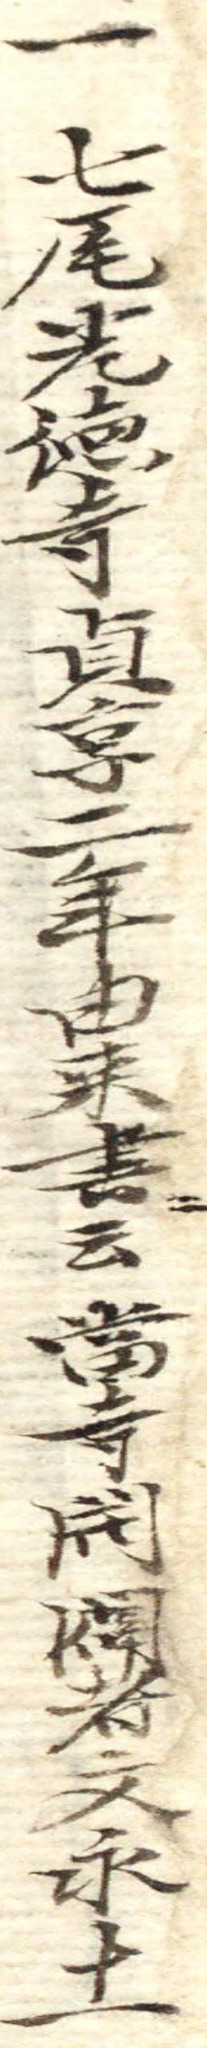一七尾光徳寺貞享二年由来書に云当寺開闢者文永十一
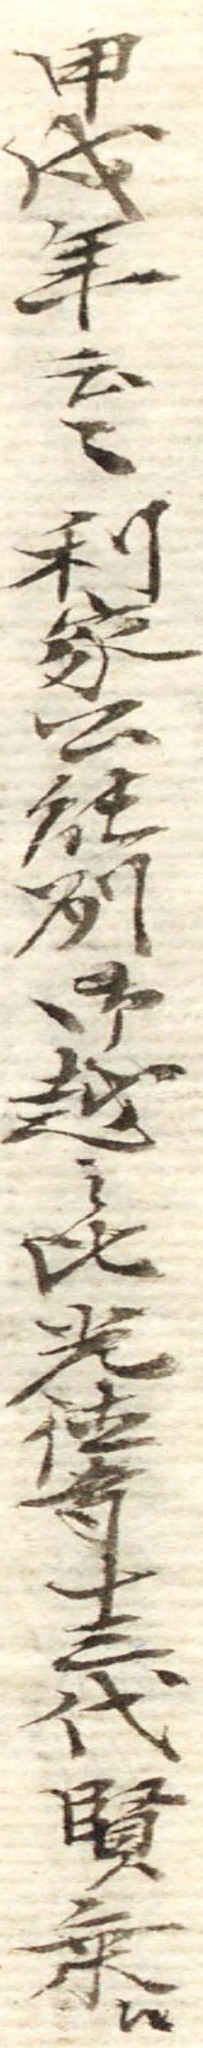甲戌年云々利家公能州御越之比光徳寺十三代賢乗候
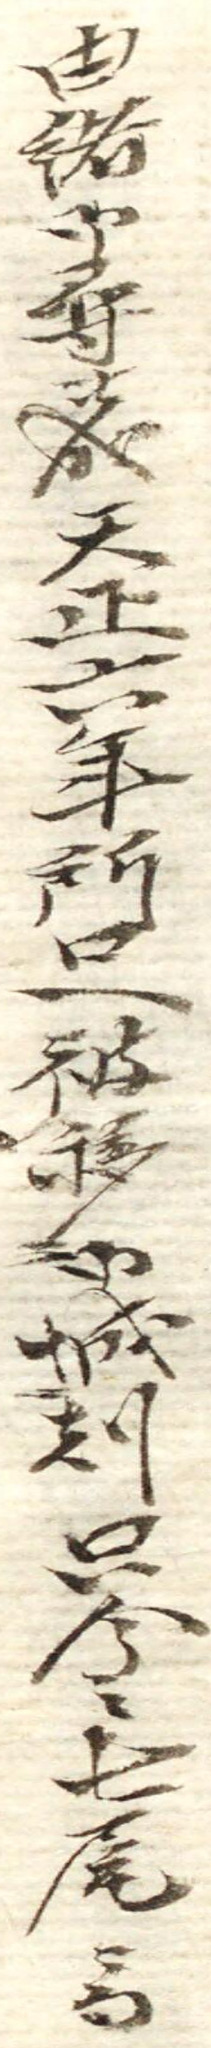由緒御尋被成天正六年所口へ被移御城刻只今七尾に而
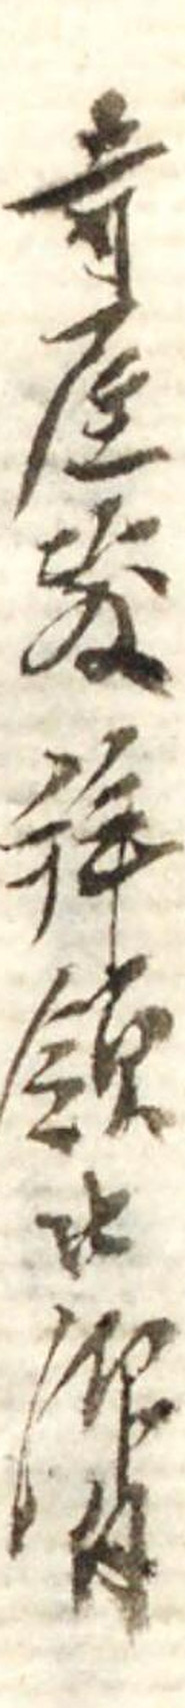寺屋敷拝領被仰付
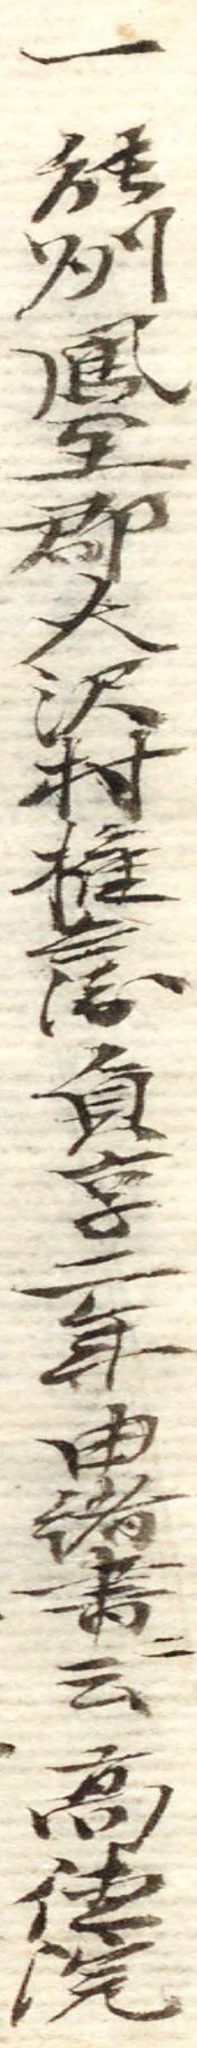一能州鳳至郡大沢村権兵衛貞享二年由緒書に云高徳院
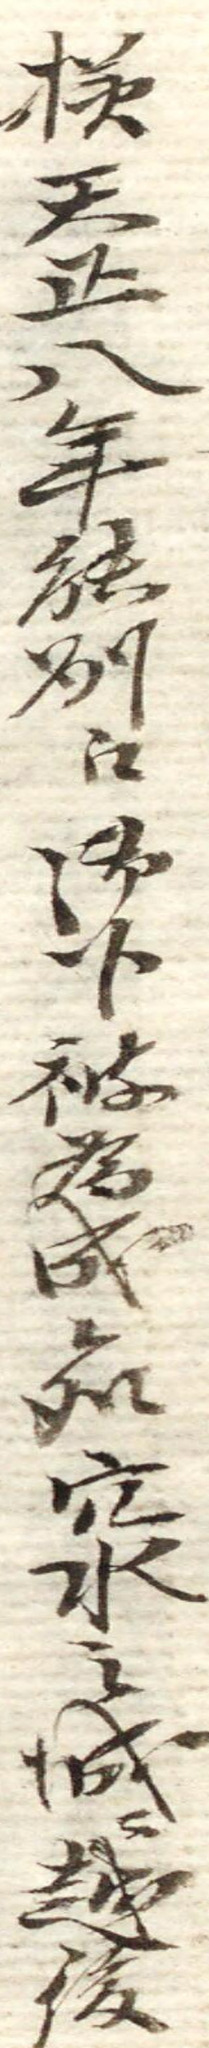様天正八年能州江御下被為成候処穴水之城に越後
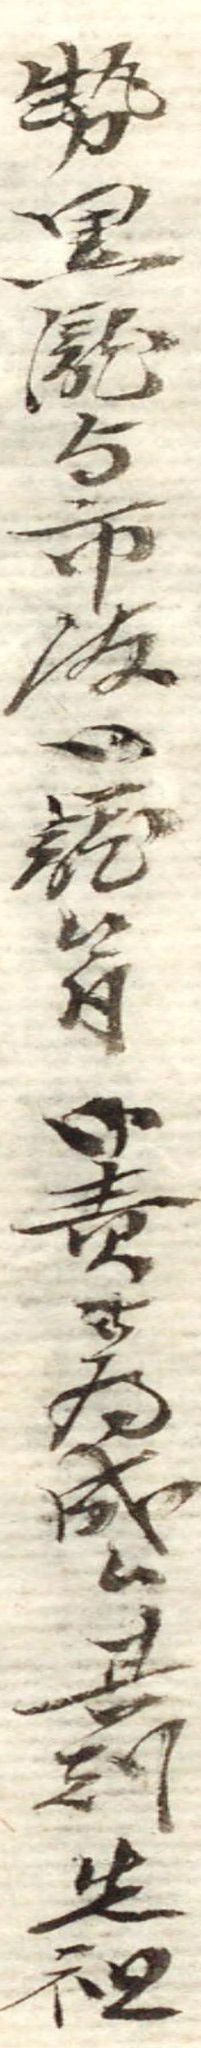勢黒瀧与市殿御籠候付御責被為成候其刻先祖
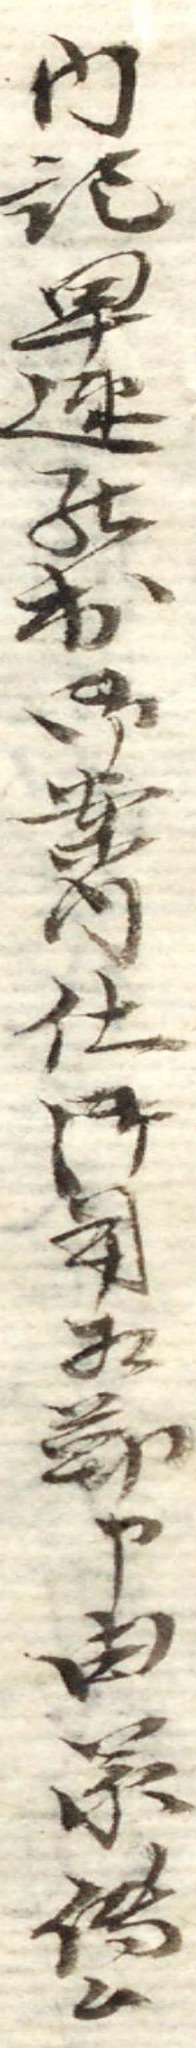内記早速罷出御案内仕御用相勤申由承傳候
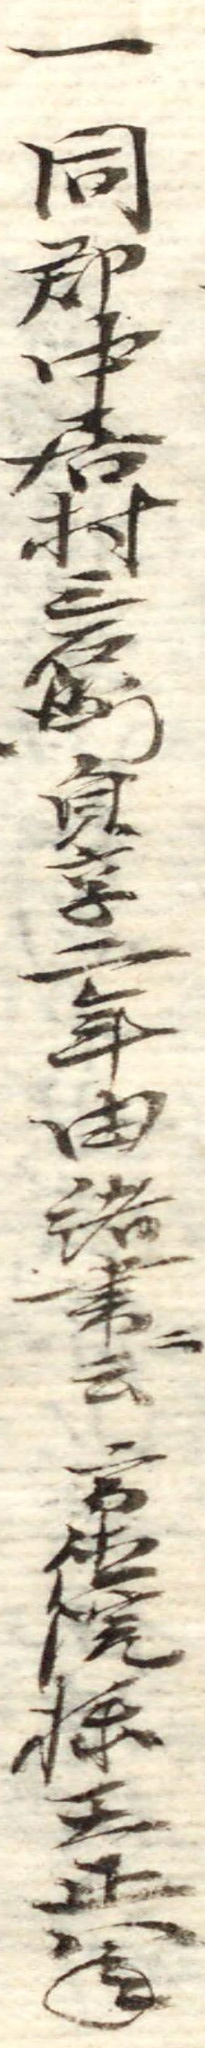一同郡中居村三右衛門貞享二年由緒書に云高徳院様天正八年
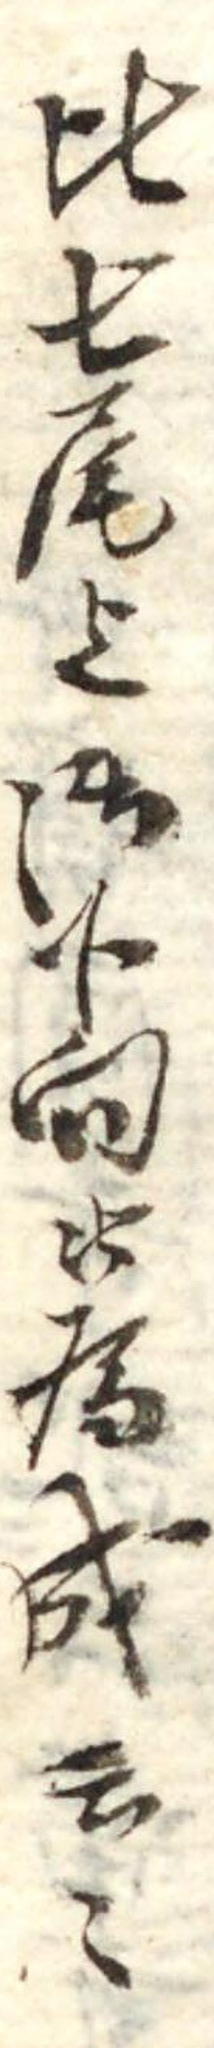比七尾迄御下向被為成云々
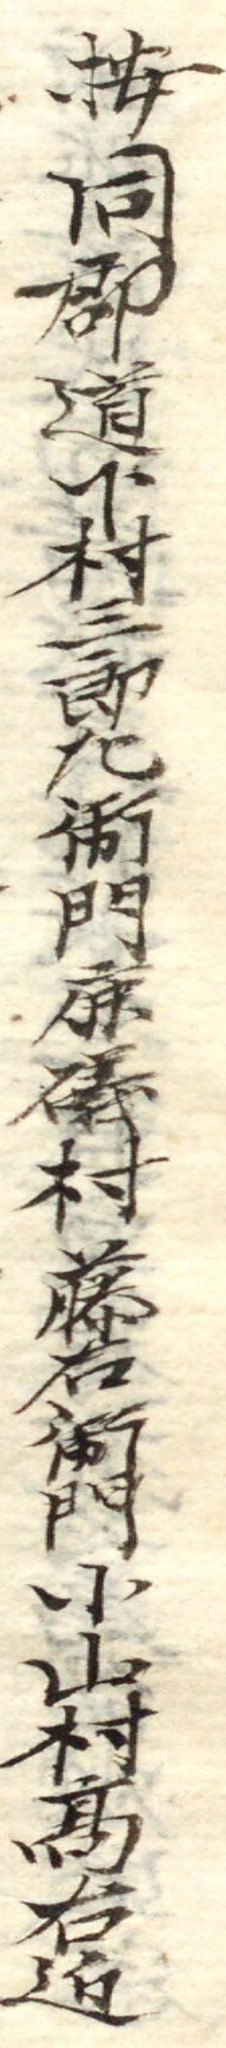按同郡道下村三郎左衛門鹿礒村藤右衛門小山村高右近
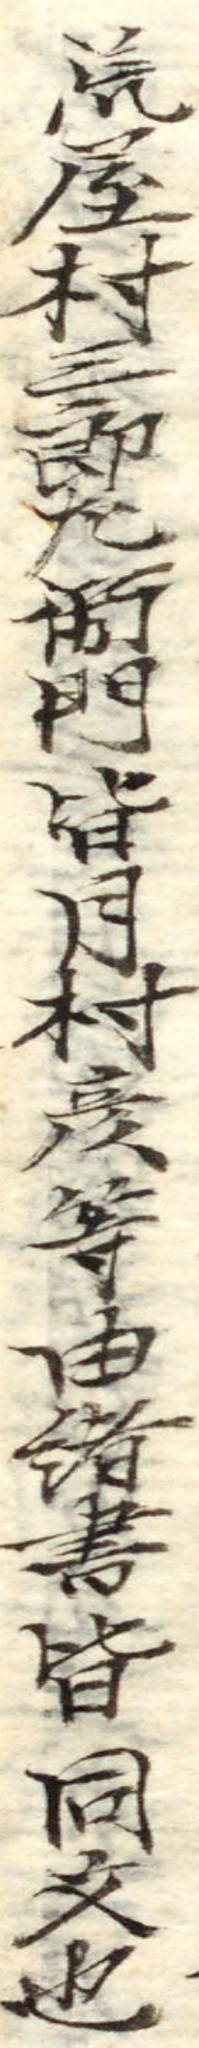荒屋村三郎左衛門皆月村彦等由緒書皆同文也
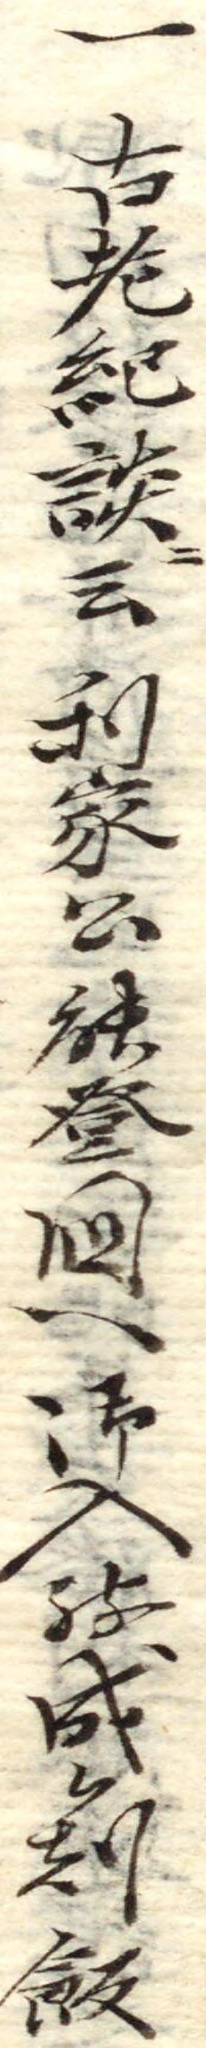一古老紀談に云利家公能登国へ御入被成候刻飯
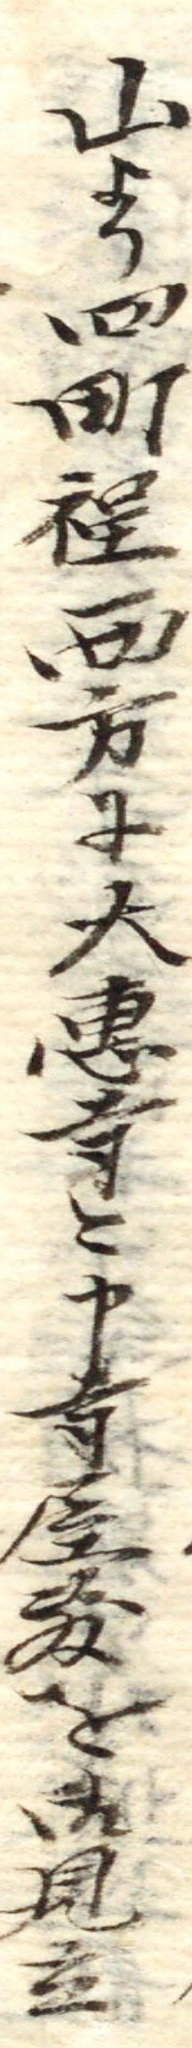山より四町程西方尓大恵寺と申寺屋敷を御見立
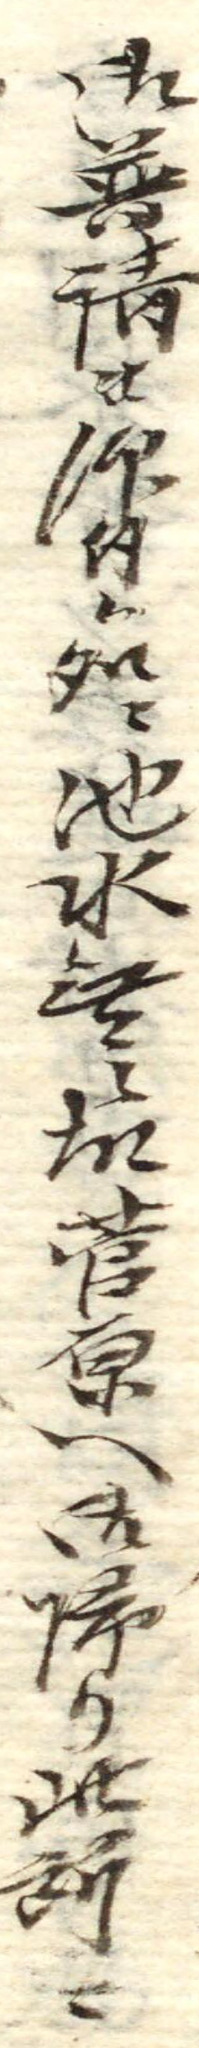御普請被仰付候処に池水無之故菅原へ御帰り此所に
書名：前田家封国証書集録
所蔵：Ishikawa Prefectural Library
